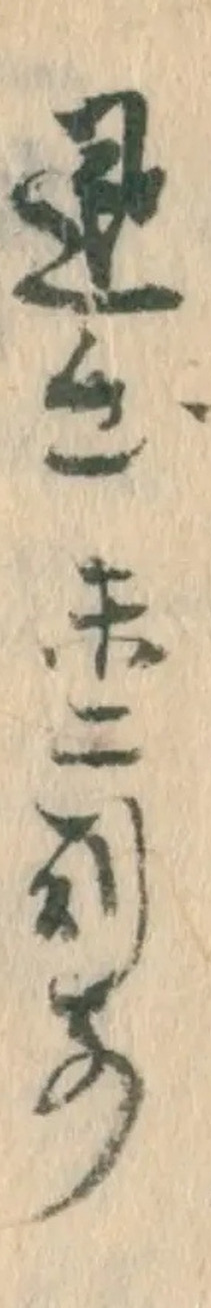退出未二刻前

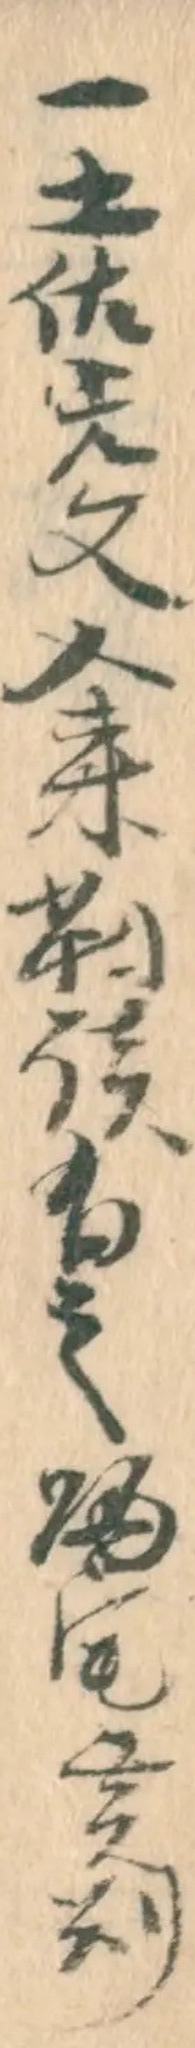一土佐光文入来対談有之帰宅亥刻
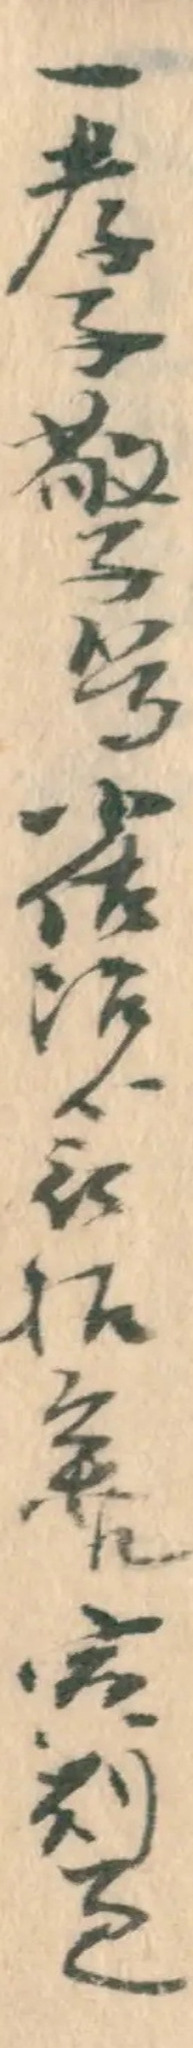一孝子敬子等小佐治ゟ被招参ル寅刻過
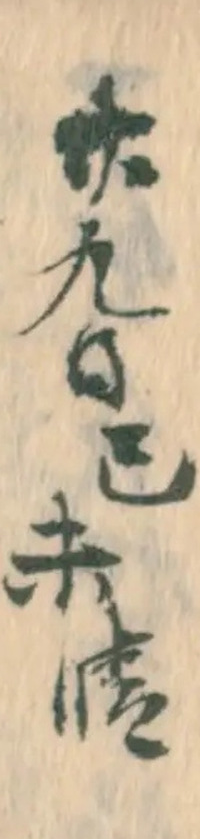廿九日己未晴
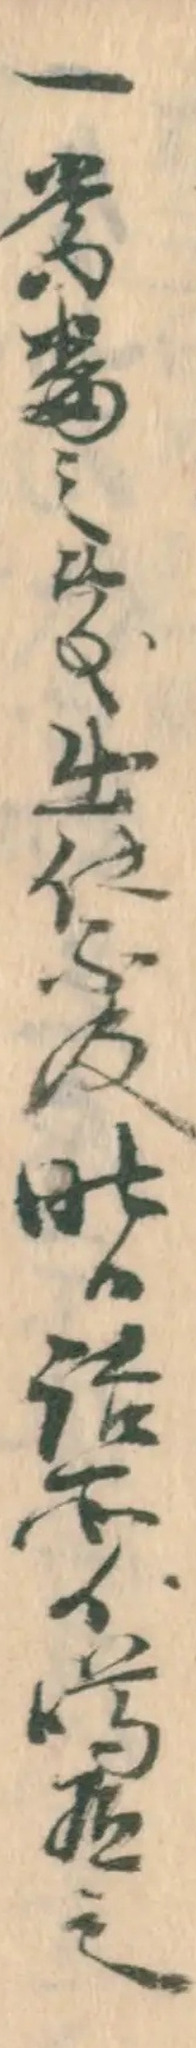一当番之処出仕不及昨日詰所ゟ噂有之
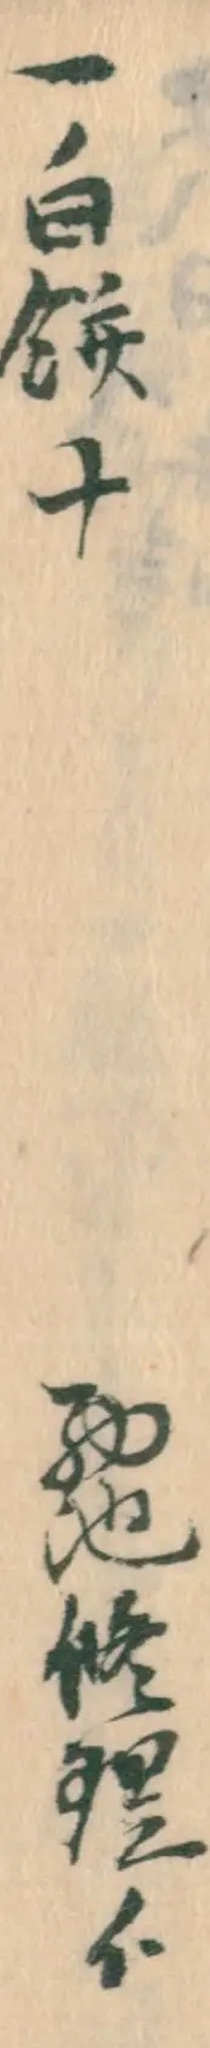一白餠十西池修理ゟ
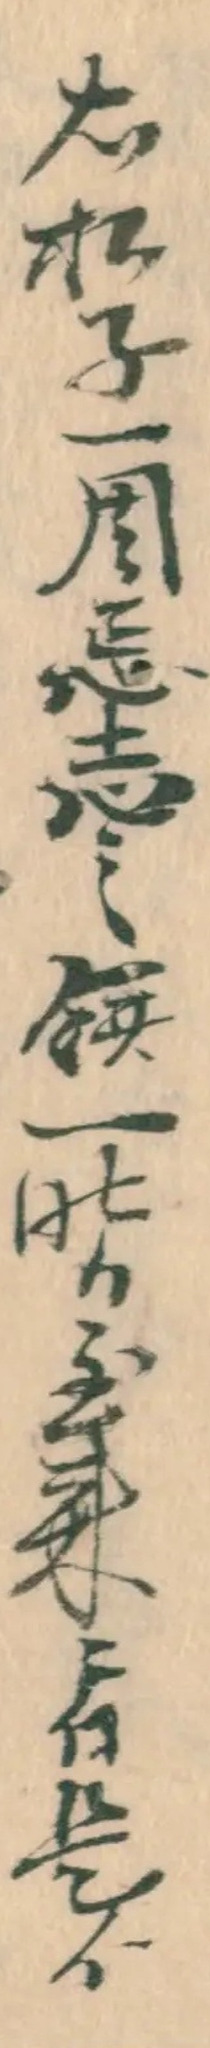右松子一周忌志之餅一昨日到来ニ付是ゟ
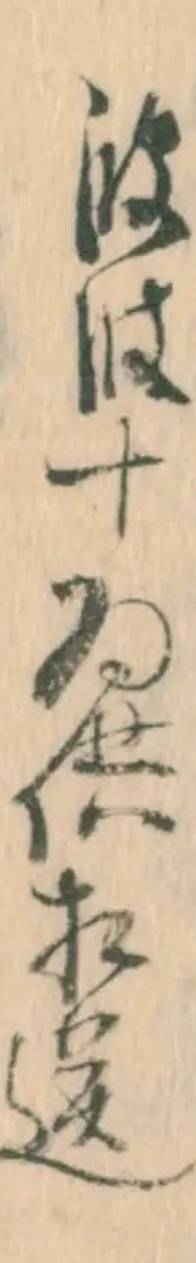彼波十為供相送
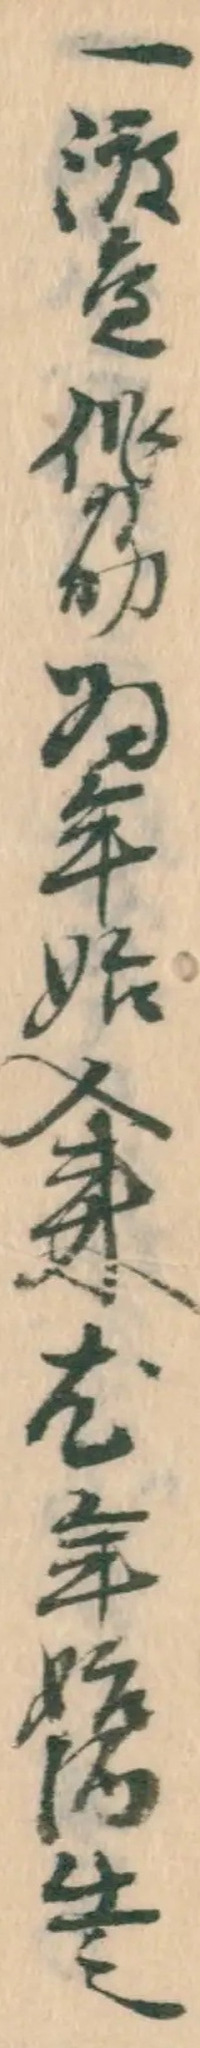一渡辺作州為年始入来尤年始酒出之
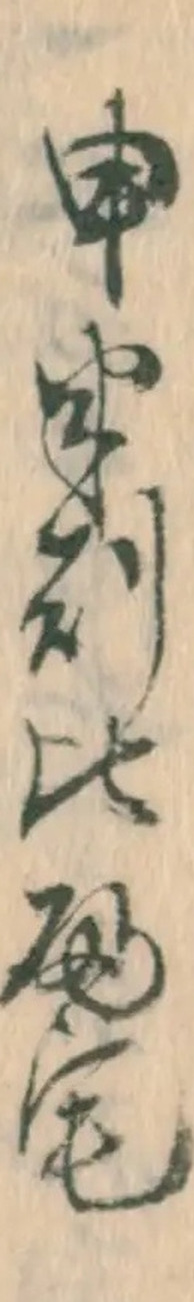申半刻頃帰宅
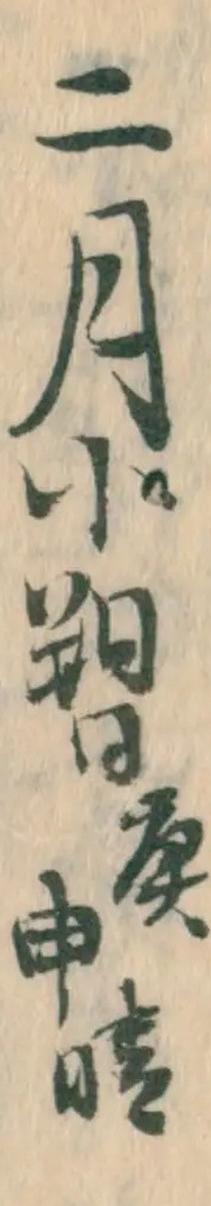二月小朔日庚申晴
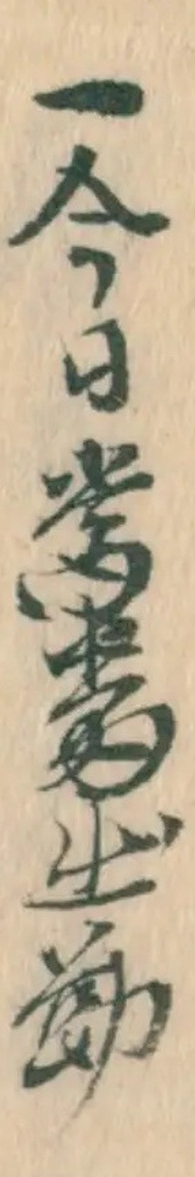一今日当番出勤
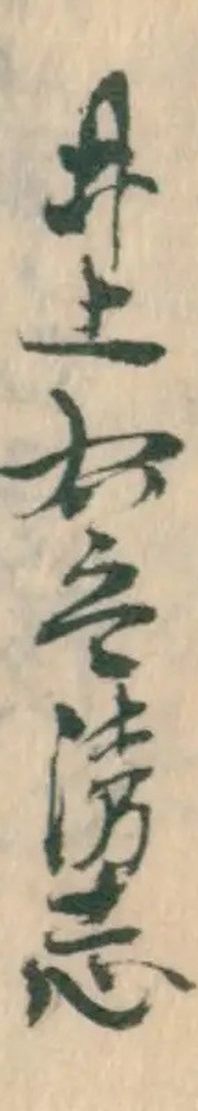一井上右兵衛志
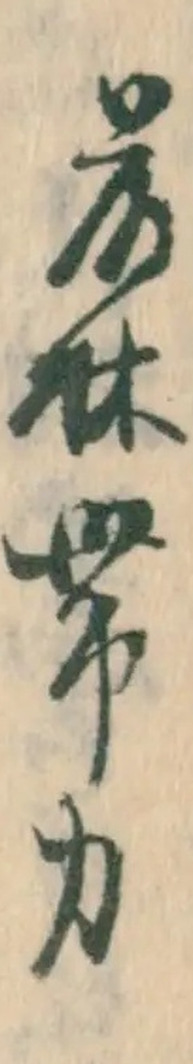藤林帯刀
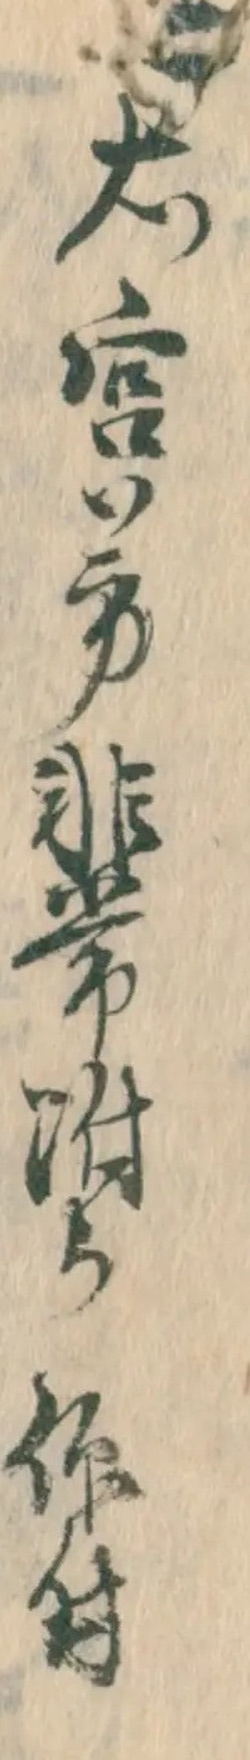一右宮御方非常附被仰付
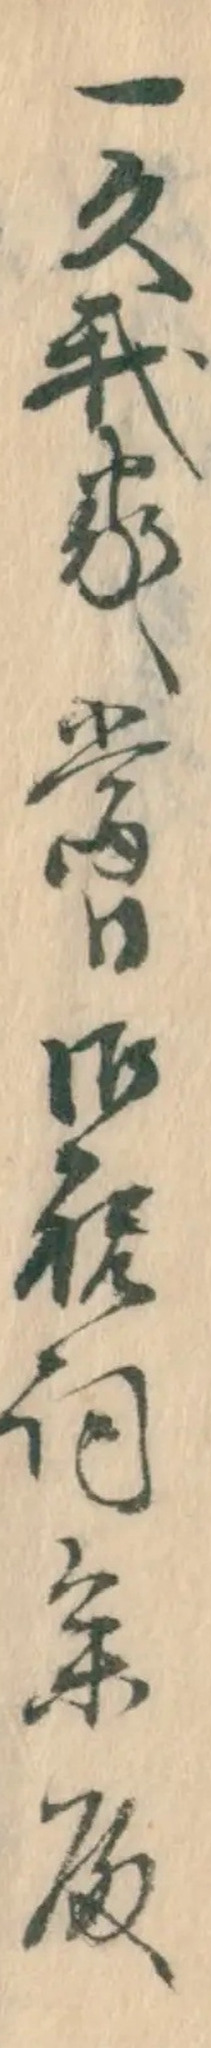一久我家へ当日御祝詞参殿
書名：禁裏御所御用日記. [131]
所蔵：国立国会図書館 National Diet Library, JAPAN
